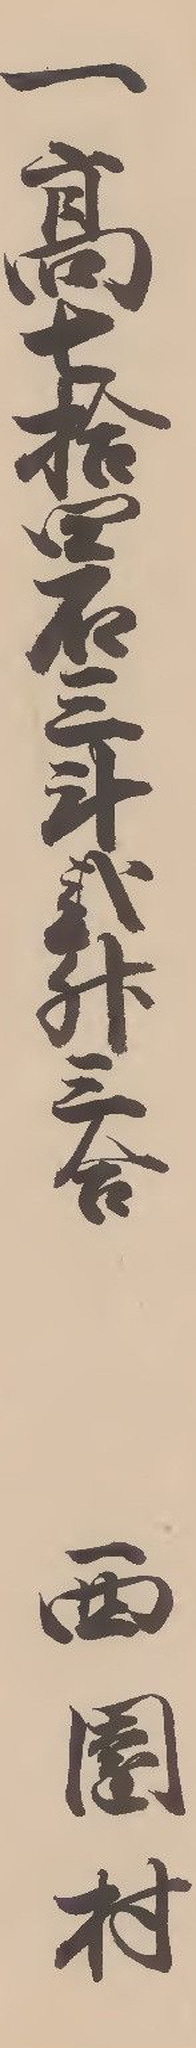一高七拾四石三斗弐升三合西園村
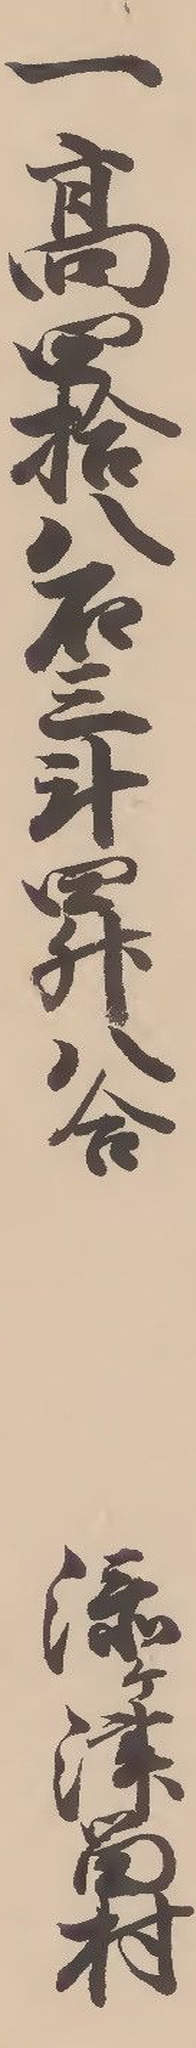一高四拾八石三斗四升八合添ヶ津留村

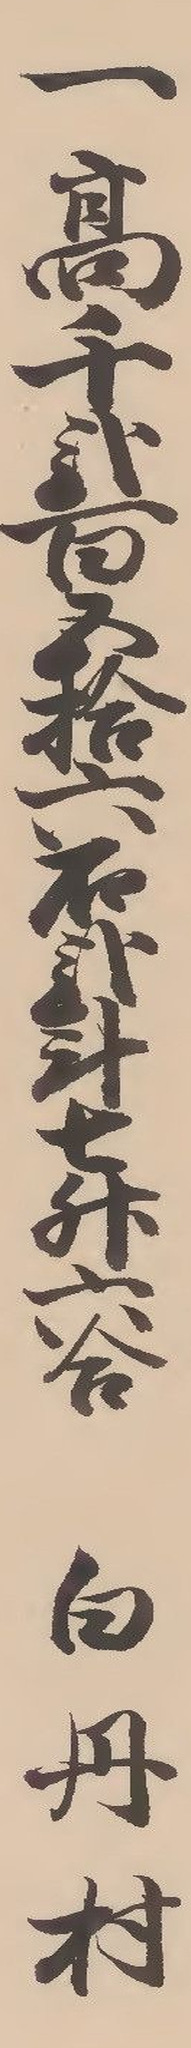一高千弐百五拾六石弐斗七升六合白丹村
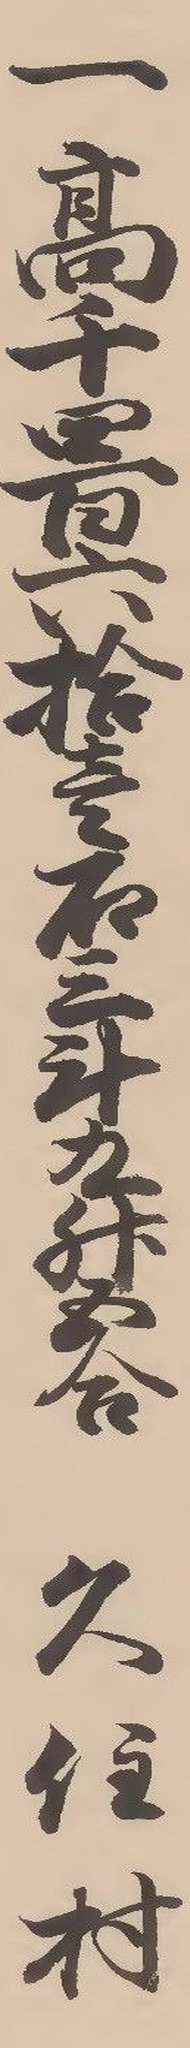一高千四百六拾壱石三斗九升五合久住村
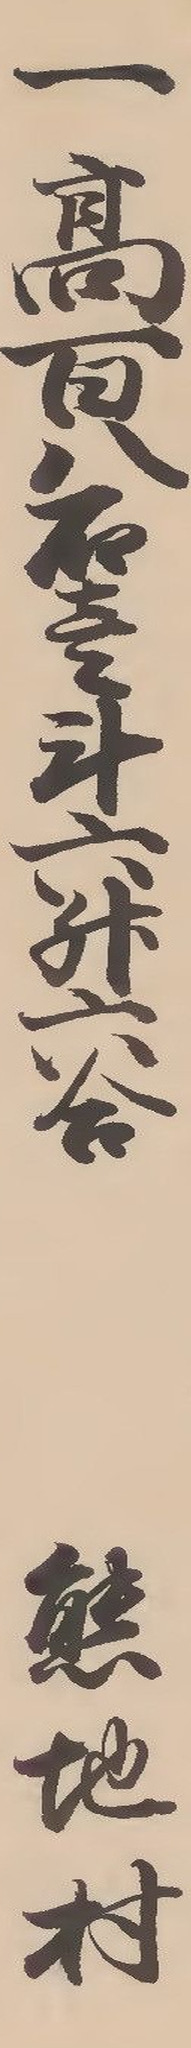一高百八石壱斗六升六合熊地村
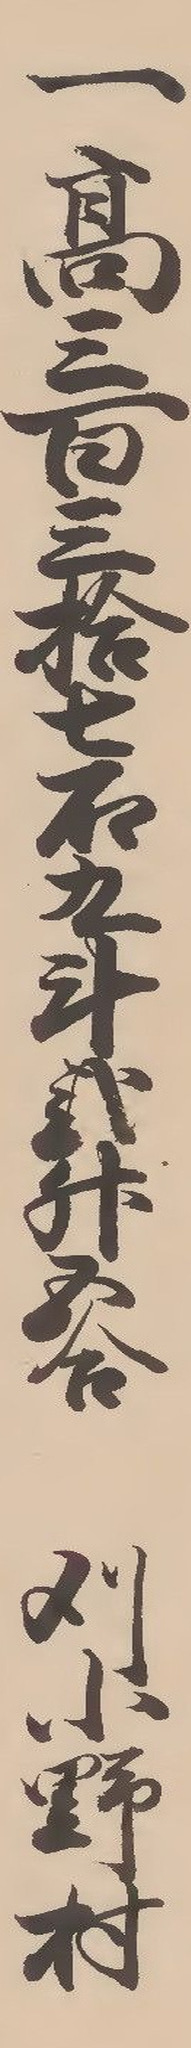一高三百三拾七石九斗弐升五合刈小野村
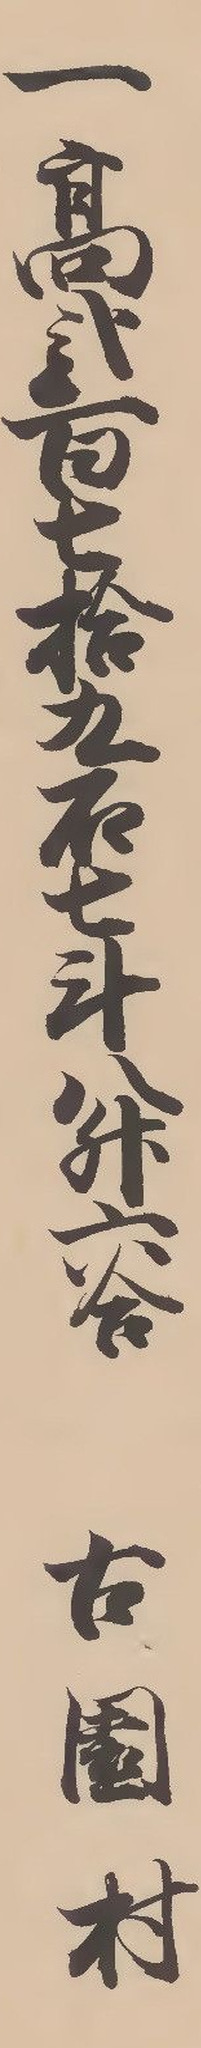一高弐百七拾九石七斗八升六合古園村
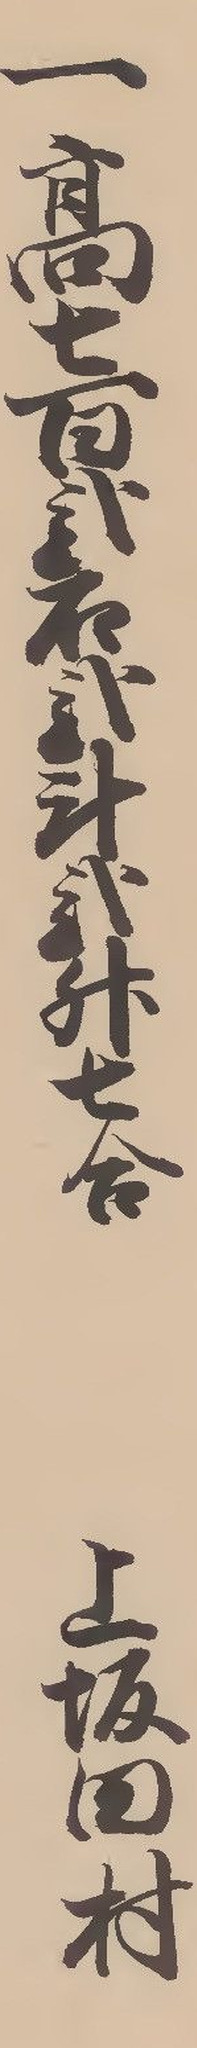一高七百弐石弐斗弐升七合上坂田村
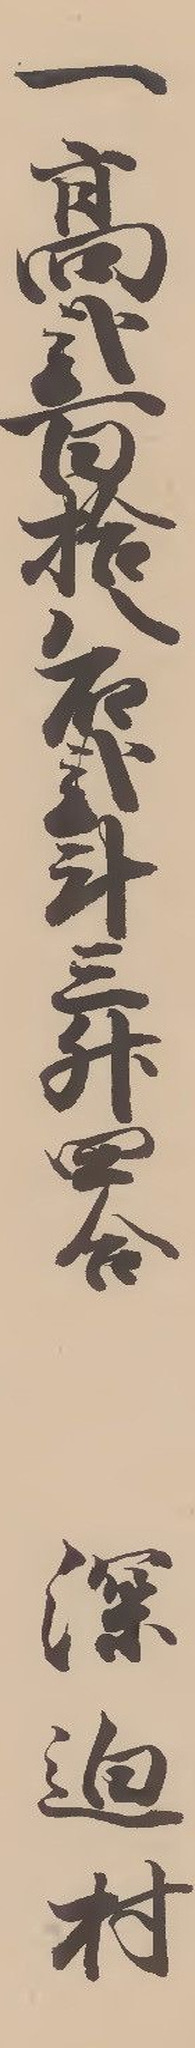一高弐百拾八石弐斗三升四合深迫村
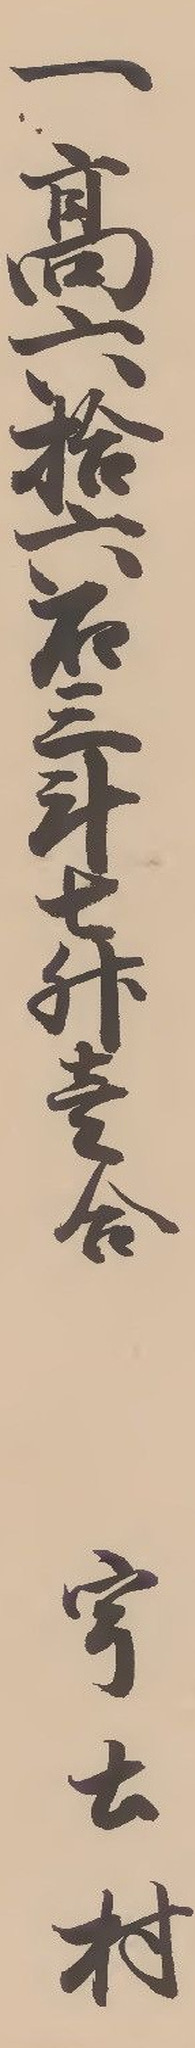一高六拾六石三斗七升壱合宇土村

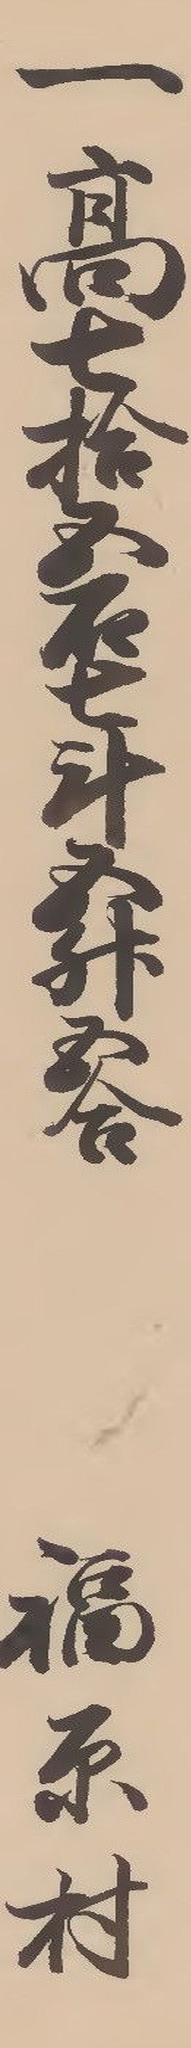一高七拾五石七斗五升五合福原村
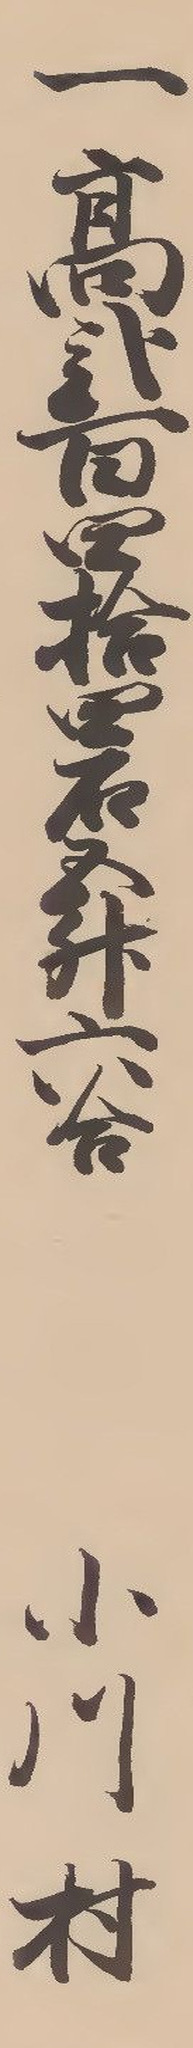一高弐百四拾四石五升六合小川村
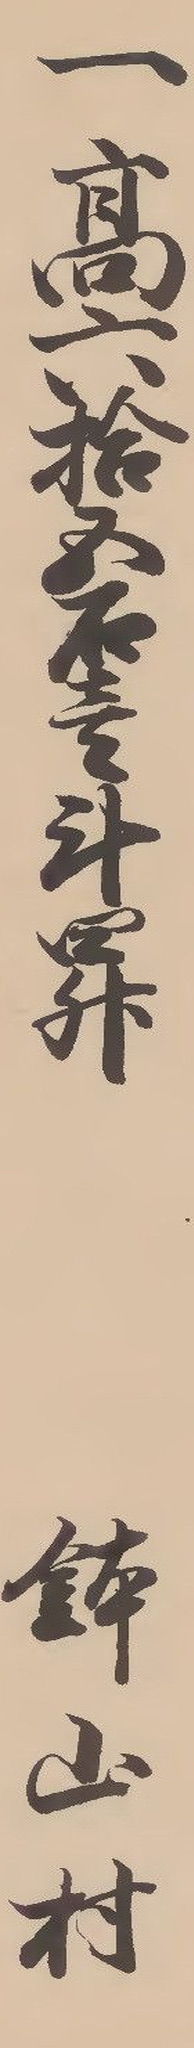一高六拾五石壱斗四升鉢山村
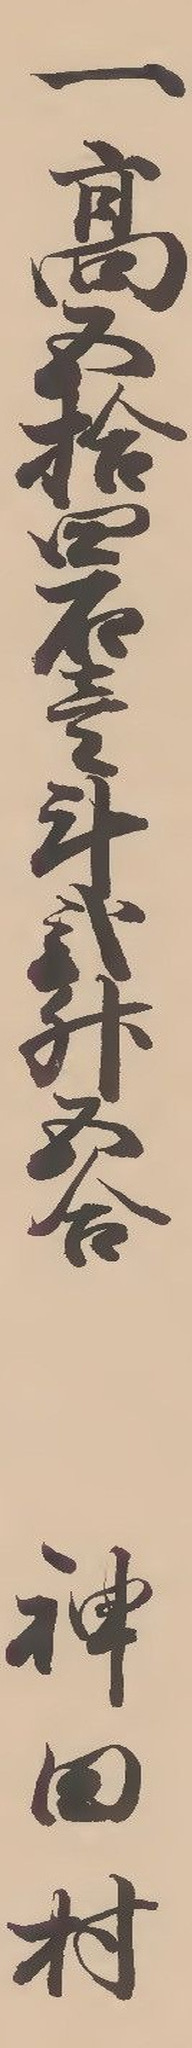一高五拾四石壱斗弐升五合神田村
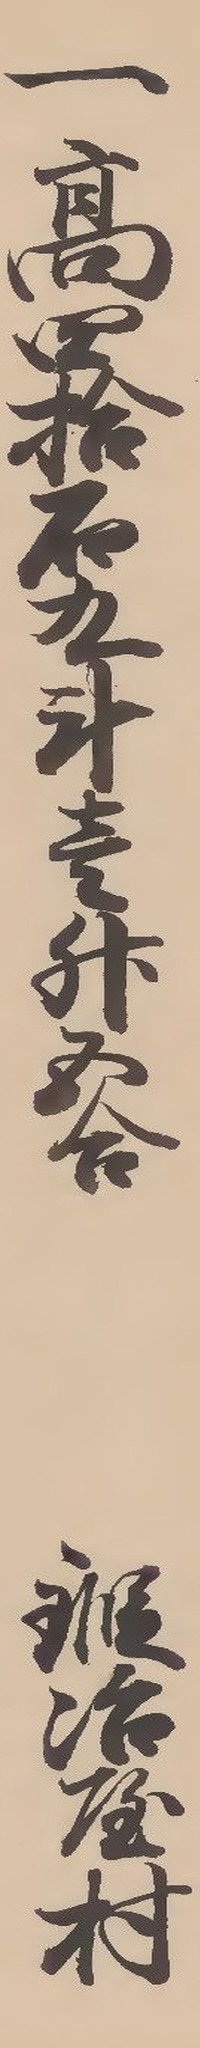一高四拾石九斗壱升五合鍛冶屋村
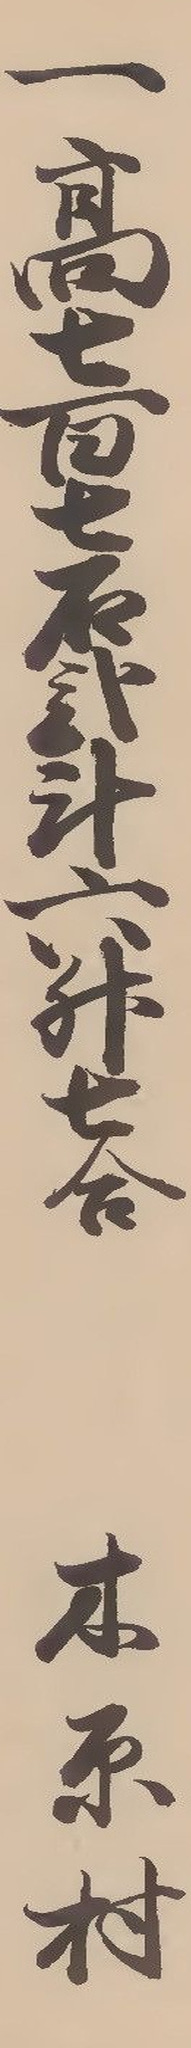一高七百七石弐斗六升七合木原村
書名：豊後国郷帳
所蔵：国立公文書館 National Archives of Japan
